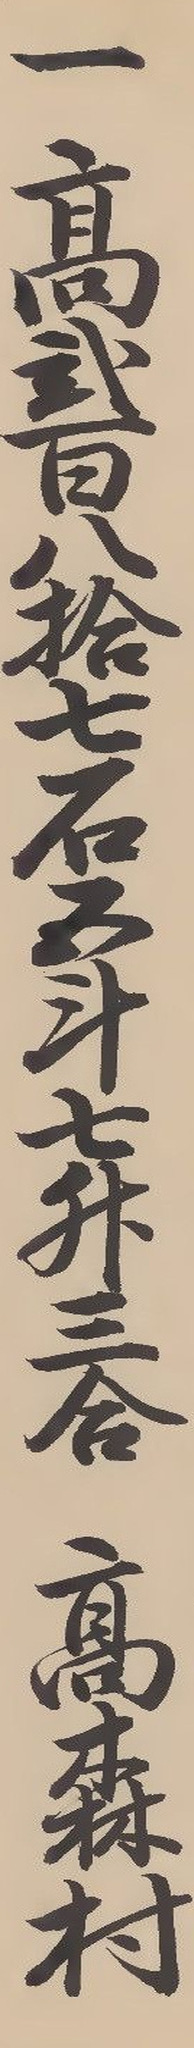一高弐百八拾七石五斗七升三合高森村
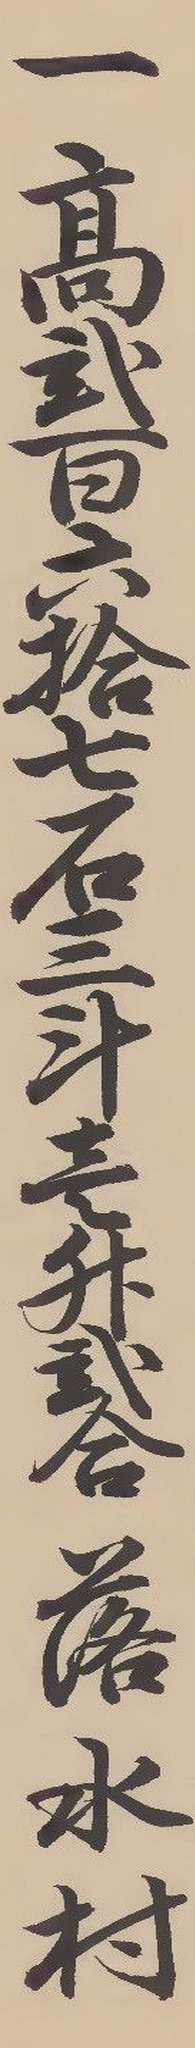一高弐百六拾七石三斗壱升弐合落水村
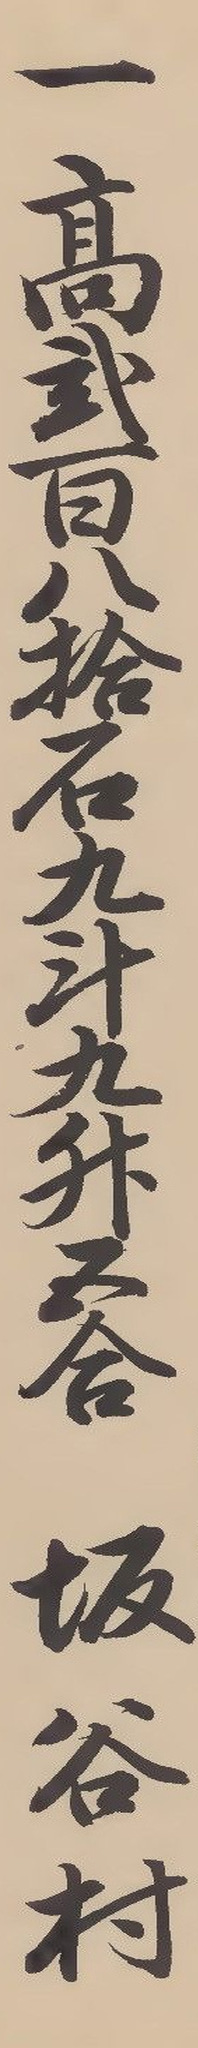一高弐百八拾石九斗九升五合坂谷村
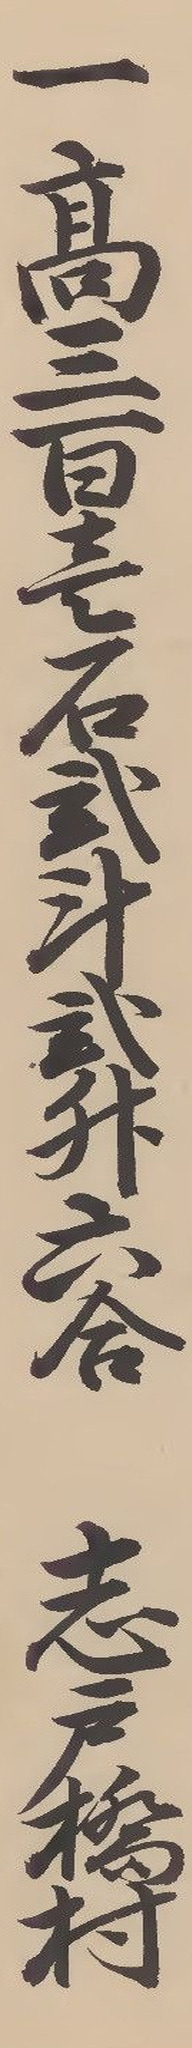一高三百壱石弐斗弐升六合志戸橋村

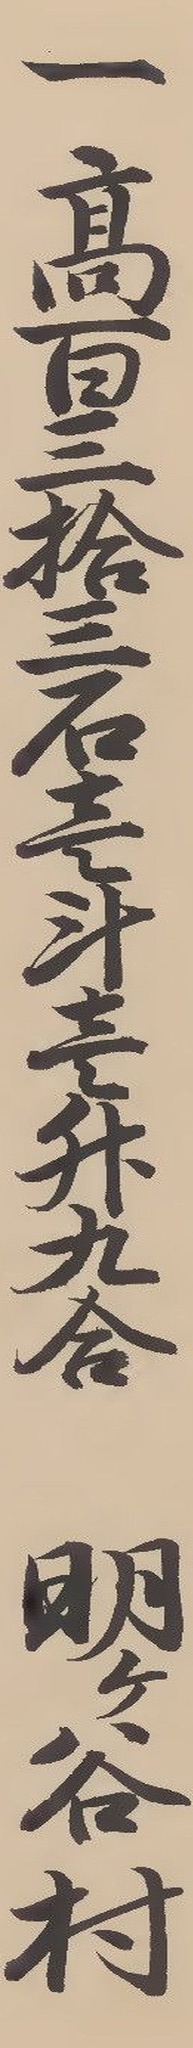一高百三拾三石壱斗壱升九合明ヶ谷村
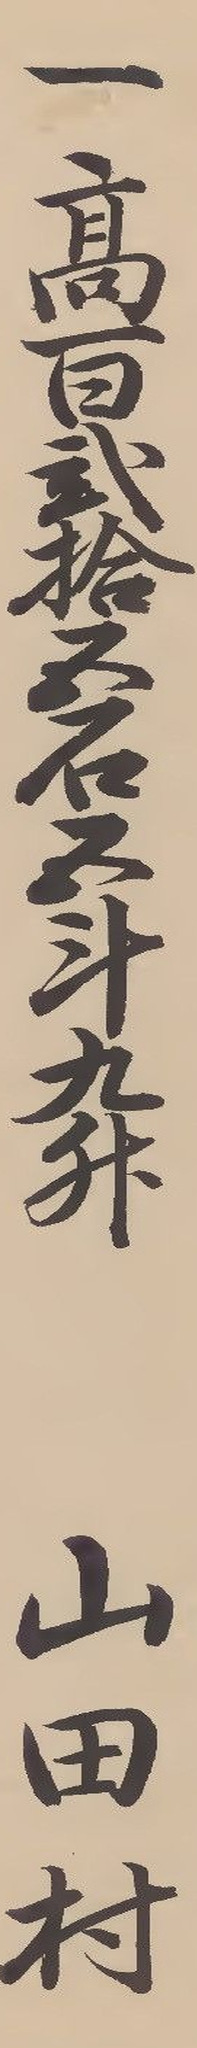一高百弐拾五石五斗九升山田村
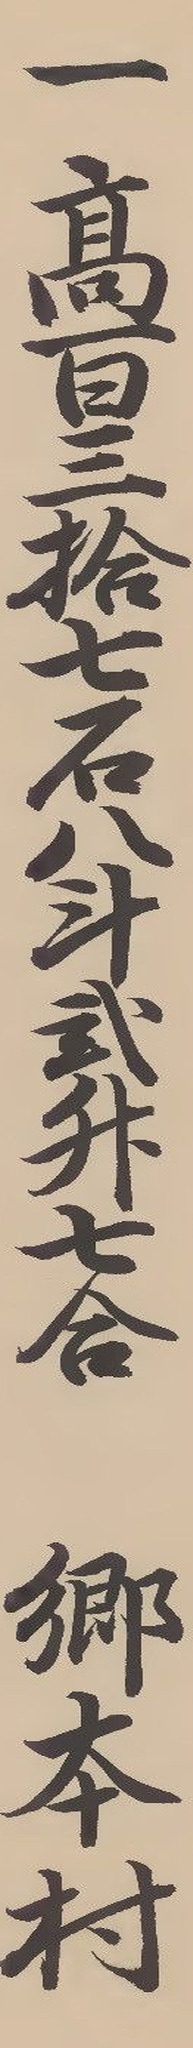一高百三拾七石八斗弐升七合郷本村
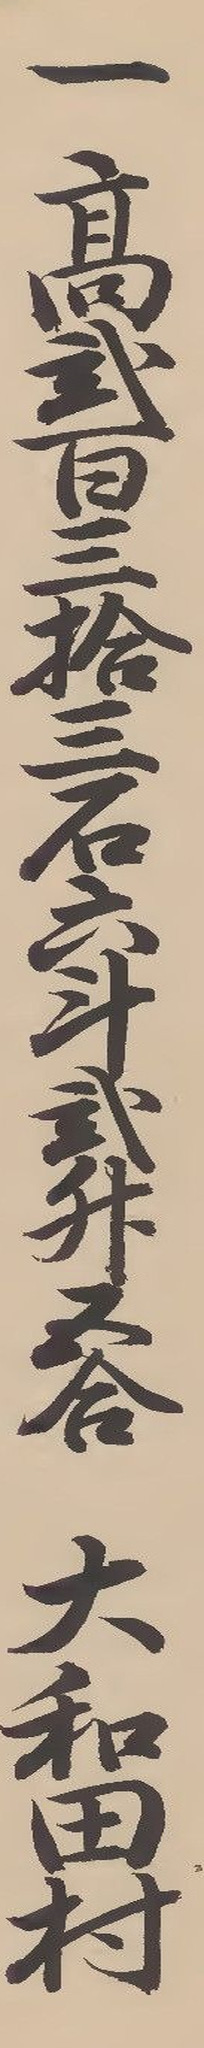一高弐百三拾三石六斗弐升五合大和田村
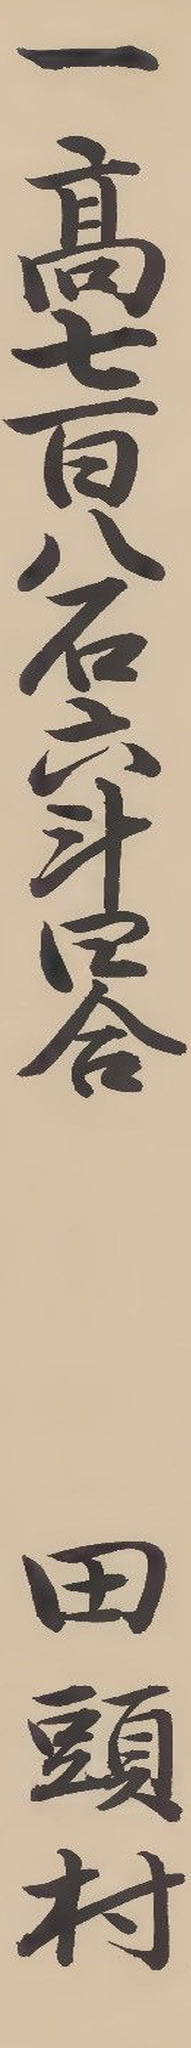一高七百八石六斗四合田頭村
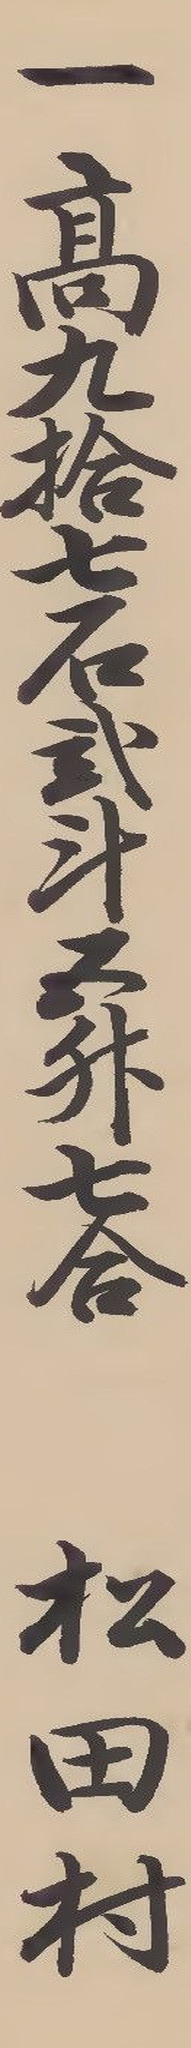一高九拾七石弐斗五升七合松田村
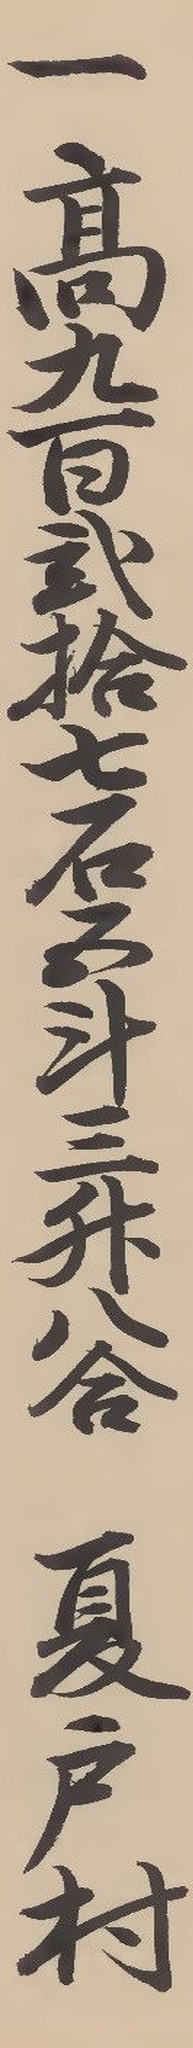一高九百弐拾七石五斗三升八合夏戸村
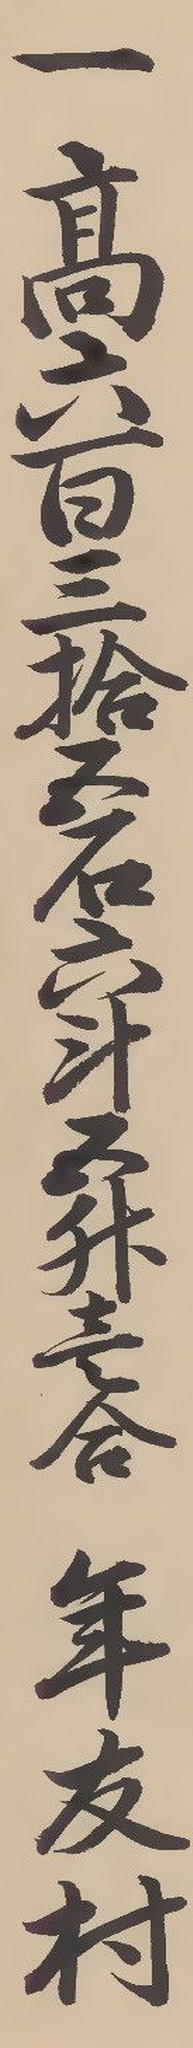一高六百三拾五石六斗五升壱合年友村

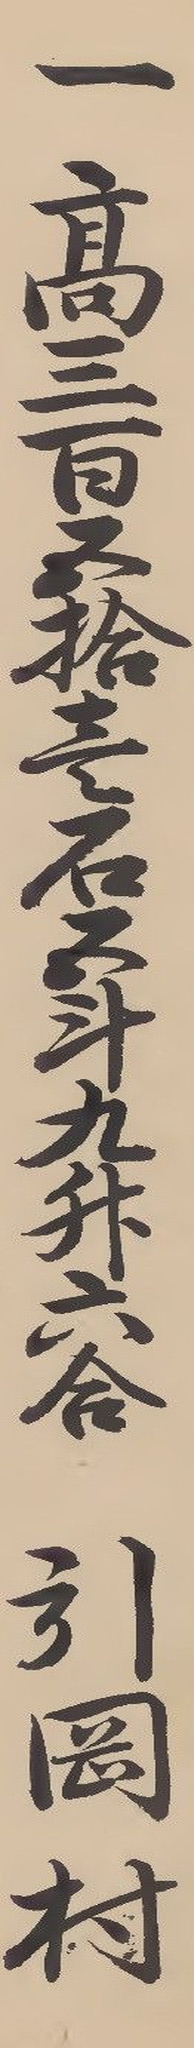一高三百五拾壱石五斗九升六合引岡村
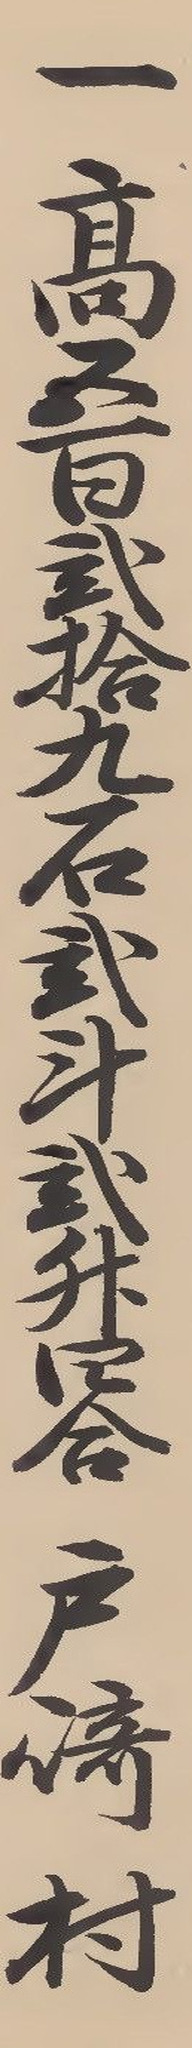一高五百弐拾九石弐斗弐升四合戸崎村
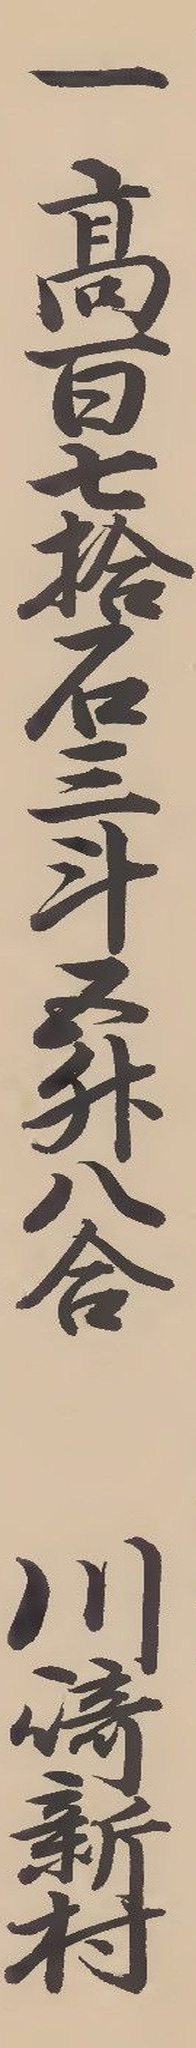一高百七拾石三斗五升八合川崎新村
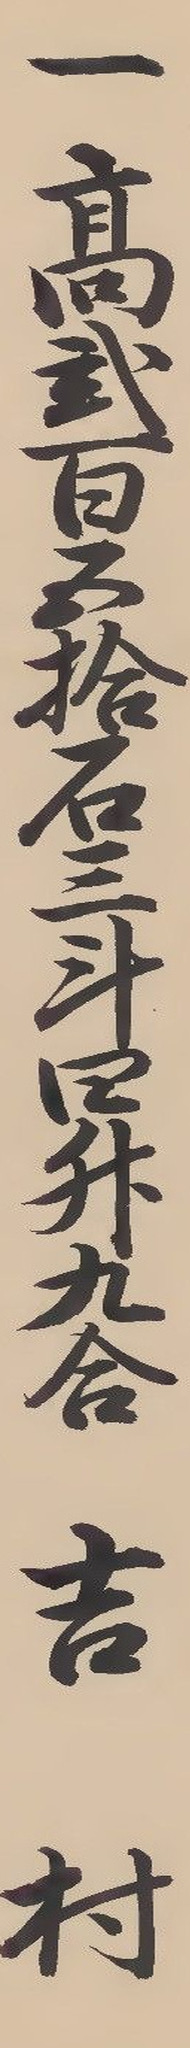一高弐百五拾石三斗四升九合吉村
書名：越後国郷帳　中
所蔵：国立公文書館 National Archives of Japan
